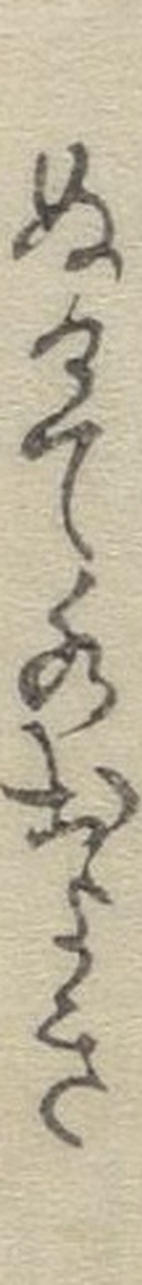ぬけて水およき
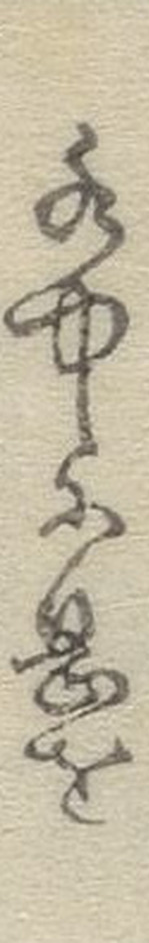水中に岡を
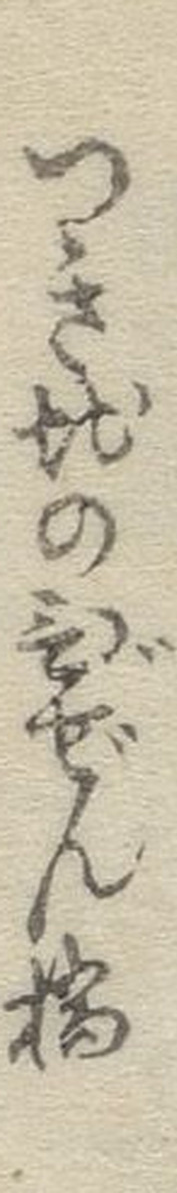つき地のびぜん橋
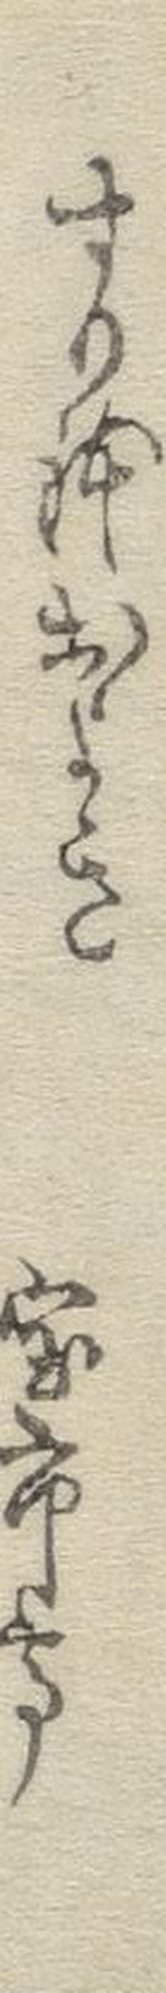すり体およき宝市亭
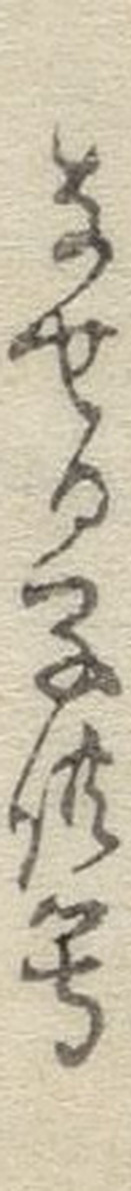なせる子供等
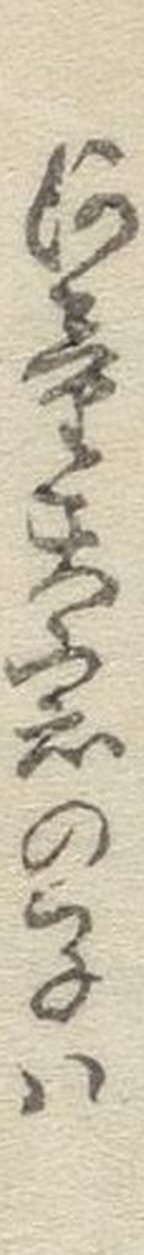河童天窓の子は
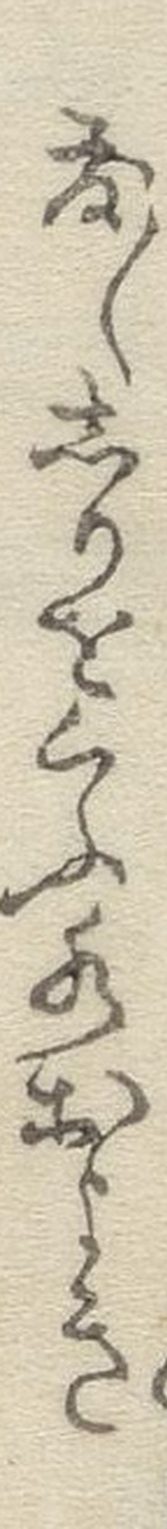度〳〵しりをくふ水およき綾波
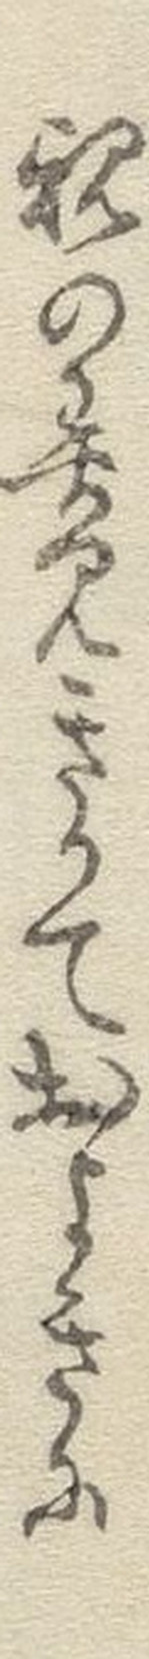親の異見きかておよきに
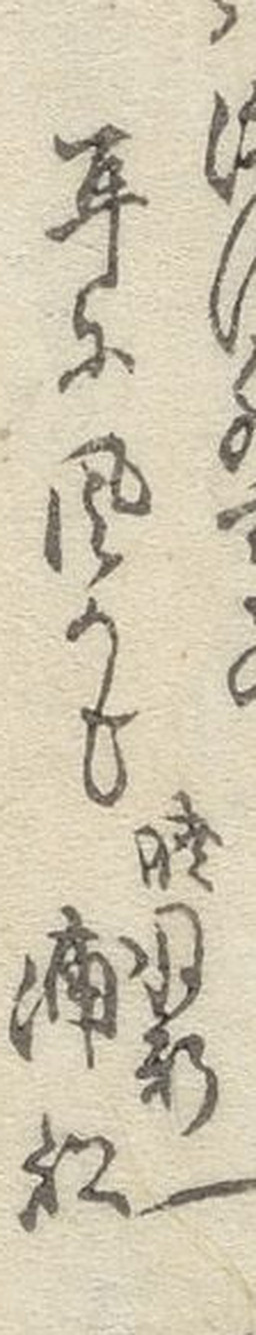耳に風かも浦舟
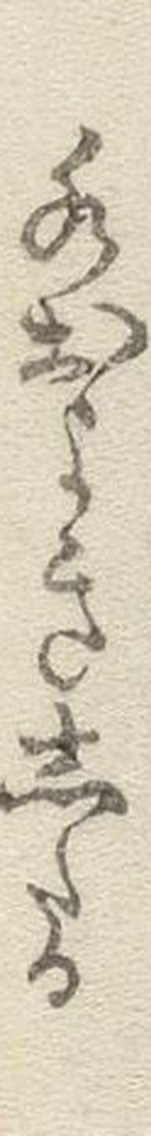水およきしたる
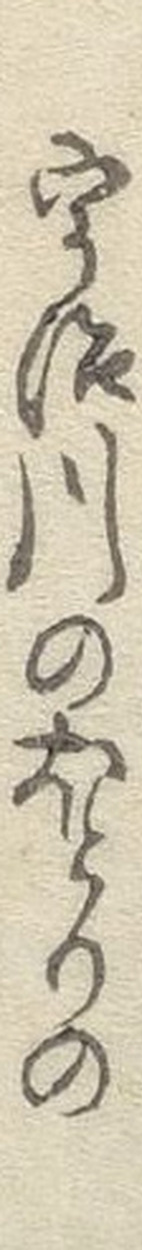宇治川のほとりの
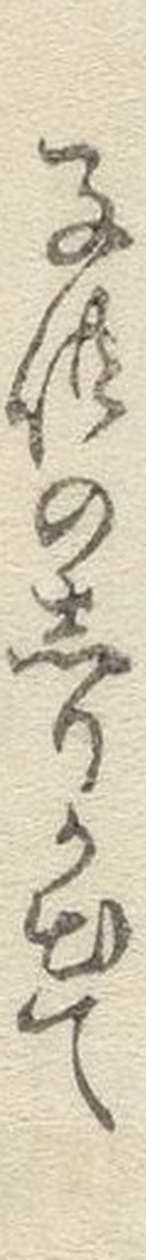子供のしりか出て
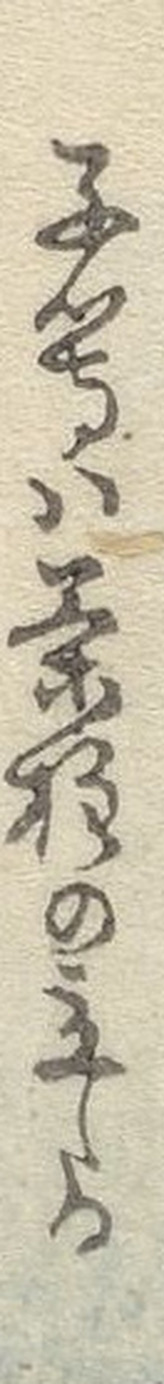子等は茶柱の立つ
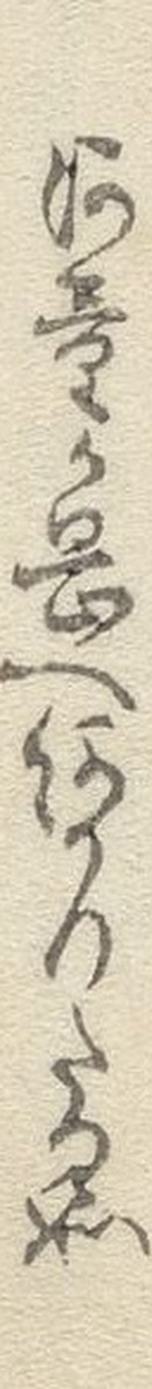河童か岡へあかりたる哉
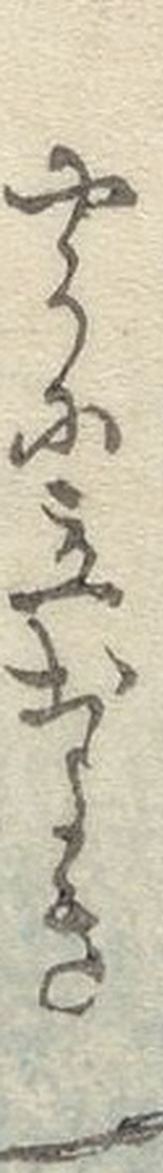やうに立およき
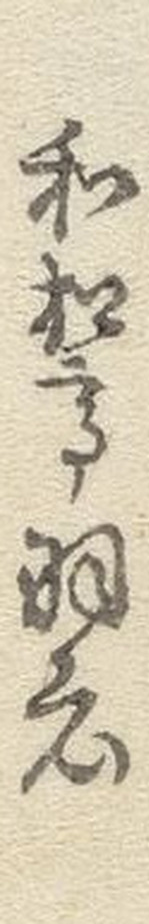和松亭羽衣
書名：Picture Album of People with Kyōka (Light Verse) (Kyōka shiki jinbutsu 狂歌四季人物)
